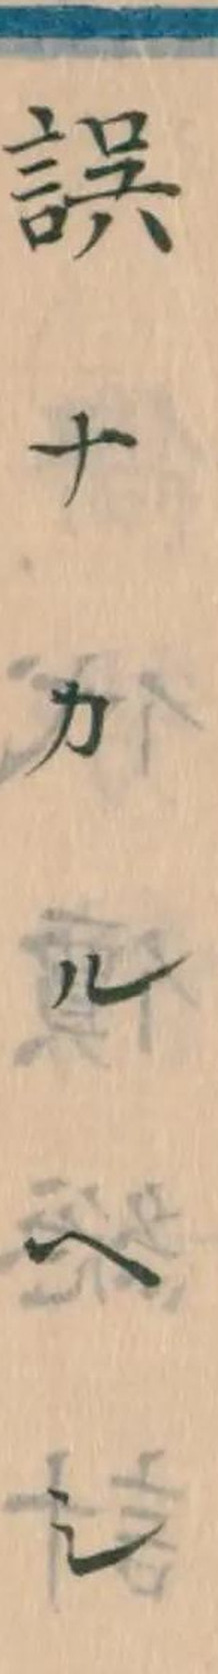誤ナカルヘシ
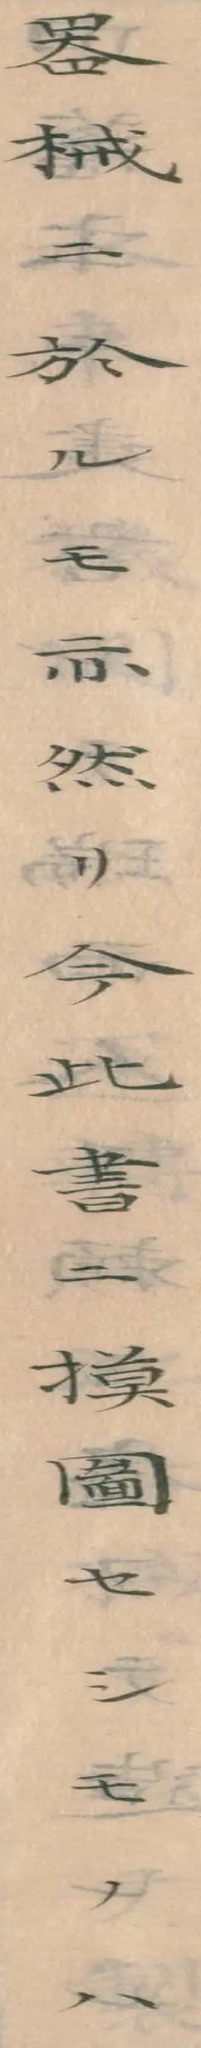器械ニ於ルモ亦然リ今此書ニ摸図セシモノハ
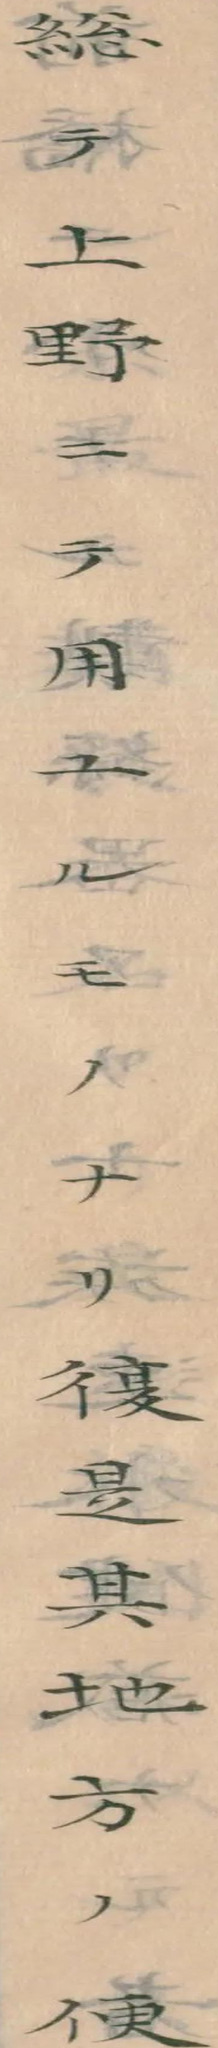総テ上野ニテ用ユルモノナリ復是其地方ノ便
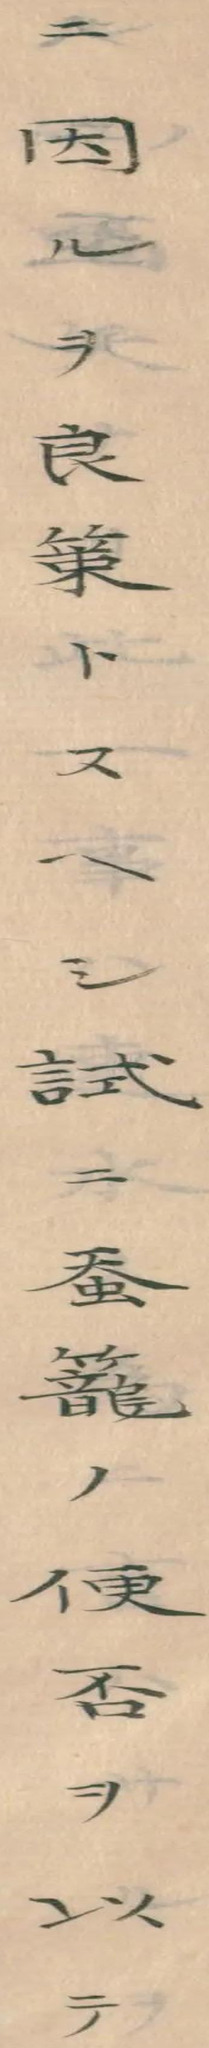ニ因ルヲ良策トスヘシ試ニ蚕籠ノ便否ヲ以テ
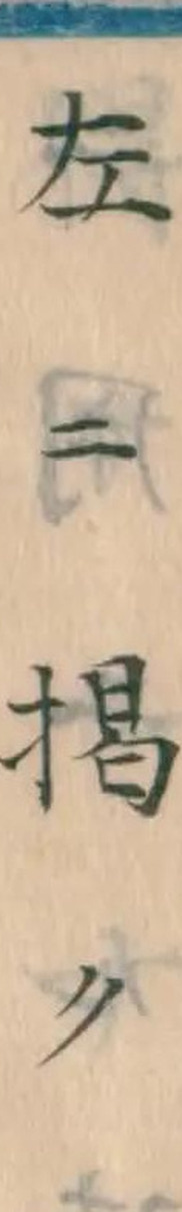左ニ掲ク
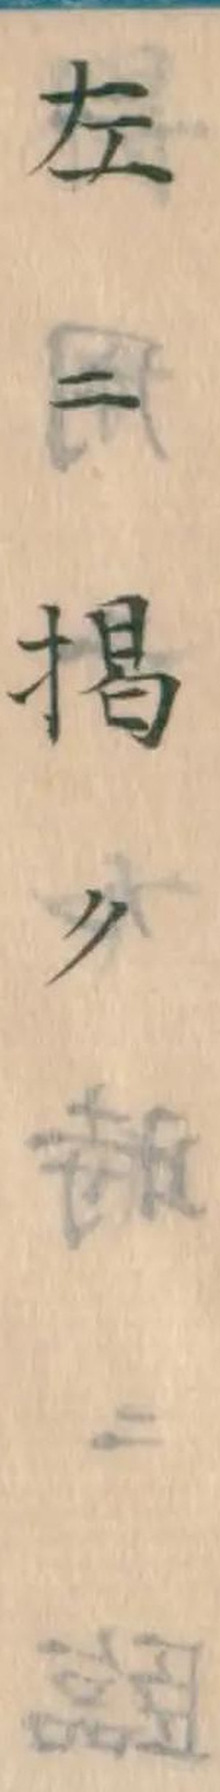左ニ掲ク
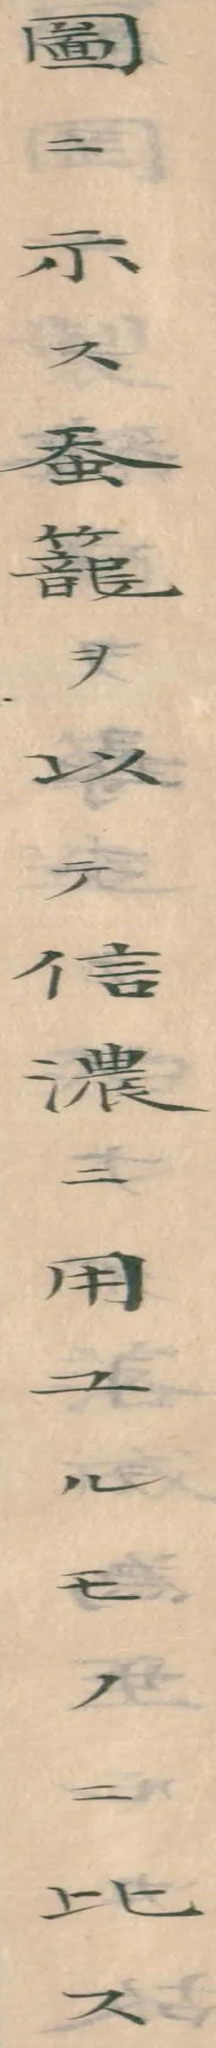図ニ示ス蚕籠ヲ以テ信濃ニ用ユルモノニ比ス
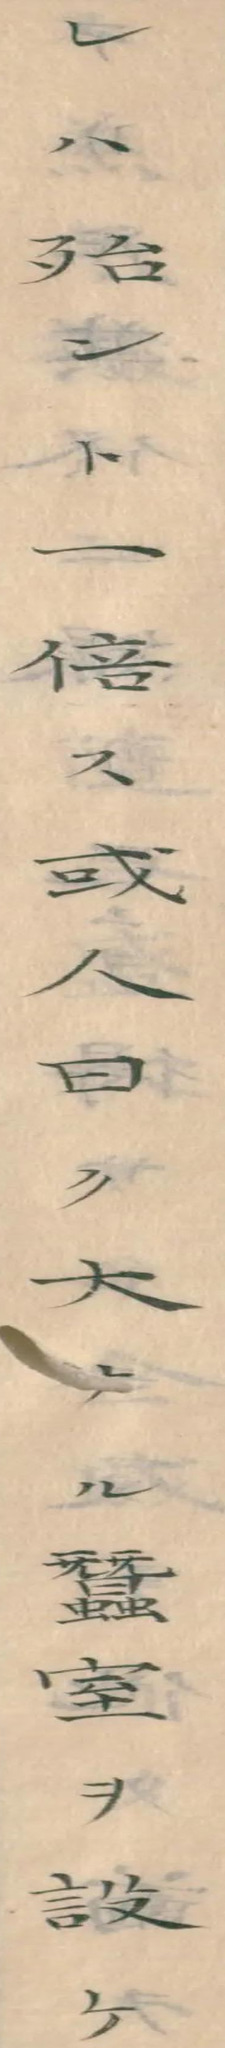レハ殆ント一倍ス或人曰ク大ナル蚕室ヲ設ケ
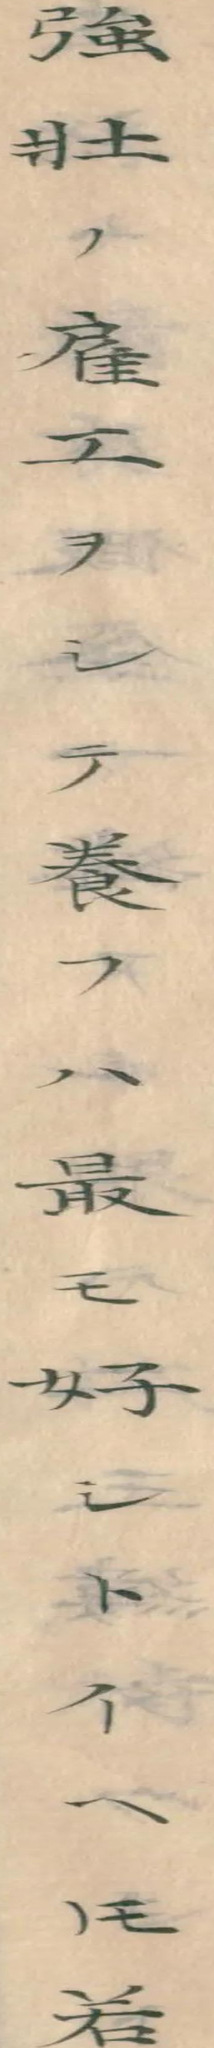強壮ノ雇工ヲシテ養フハ最モ好シトイヘトモ若
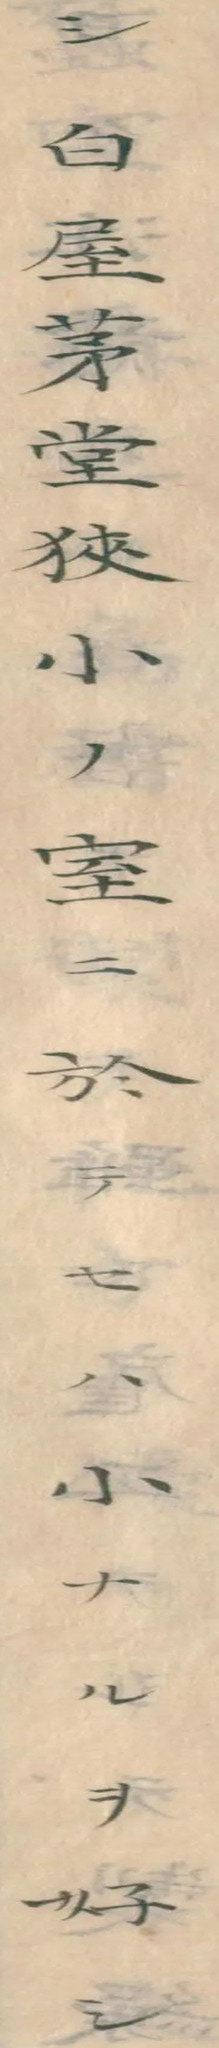シ白屋茅堂狭小ノ室ニ於テセハ小ナルヲ好シ
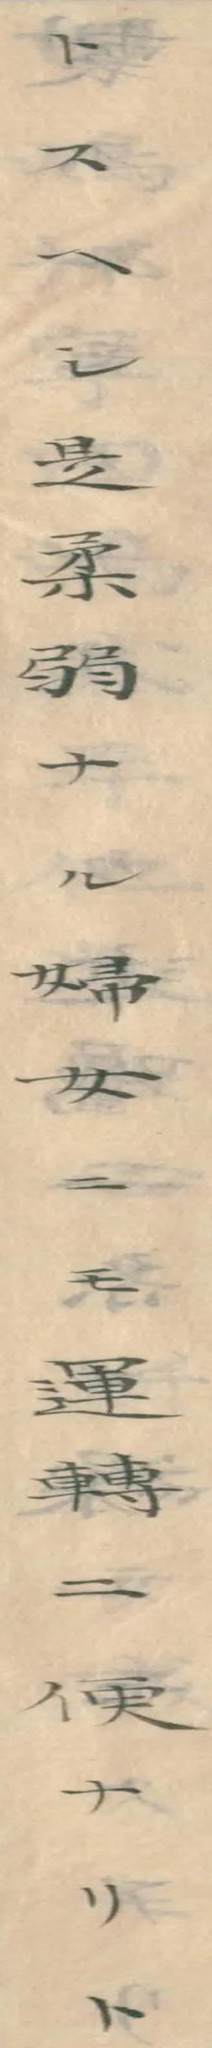トスヘシ是柔弱ナル婦女ニモ運転ニ便ナリト
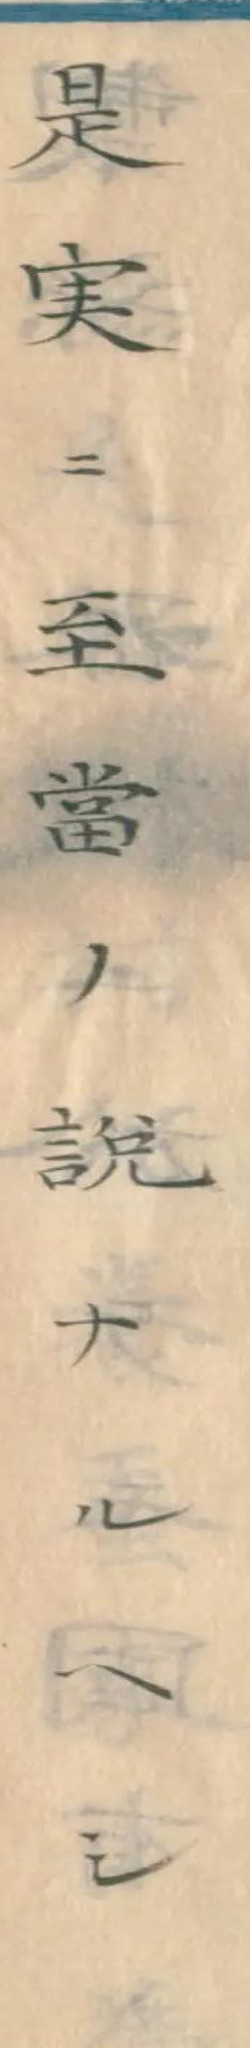是実ニ至当ノ説ナルヘシ
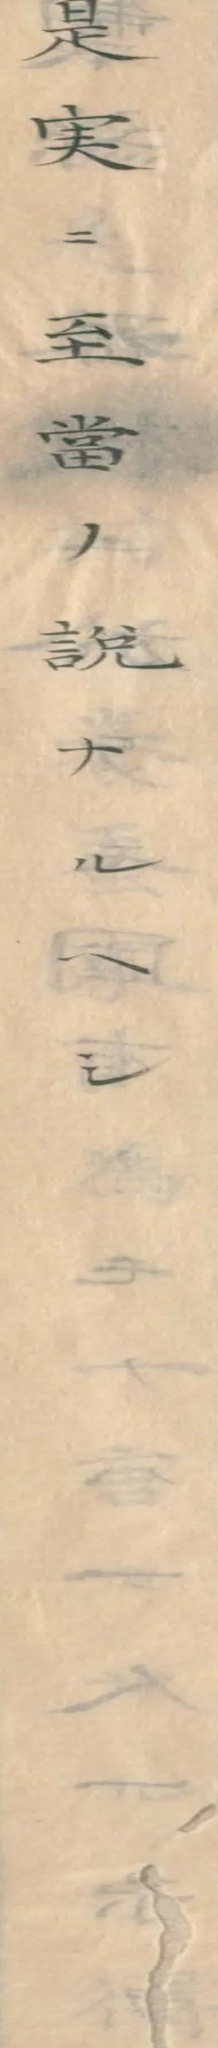是実ニ至当ノ説ナルヘシ

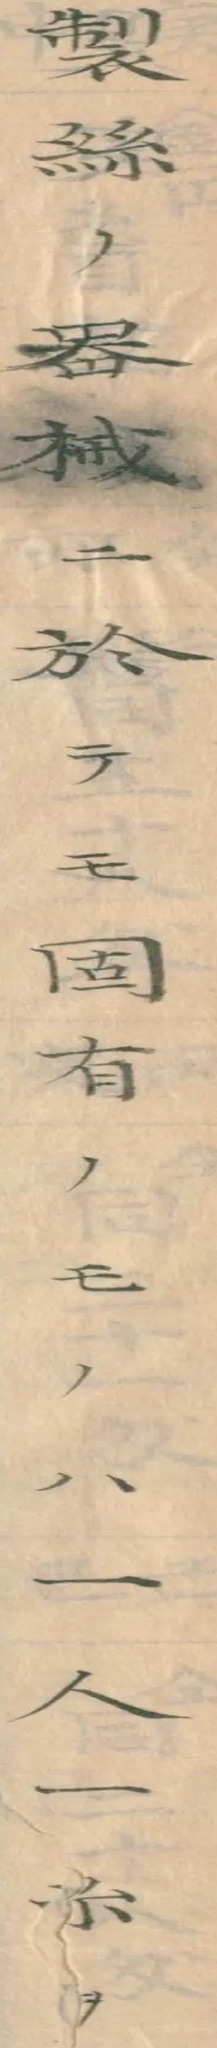製糸ノ器械ニ於テモ固有ノモノハ一人一糸ヲ
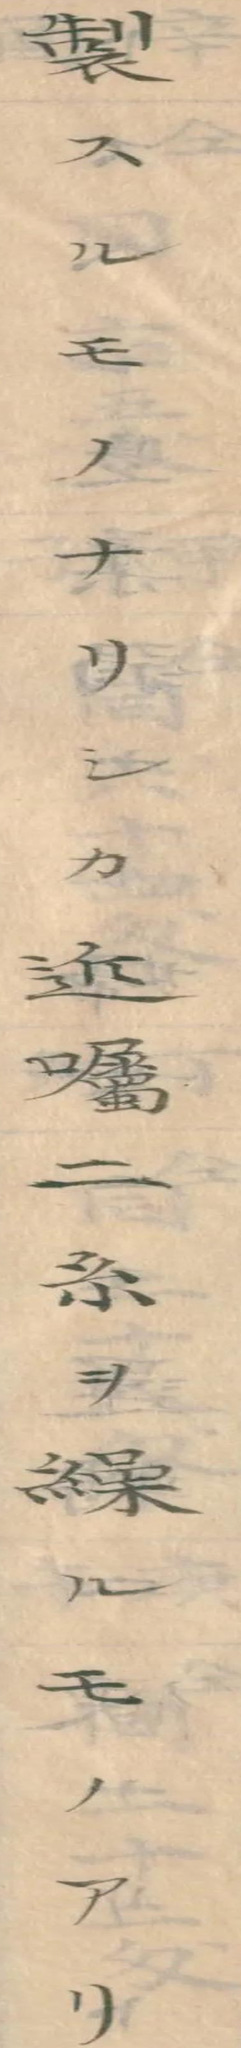製スルモノナリシカ近嘱二糸ヲ繰ルモノアリ
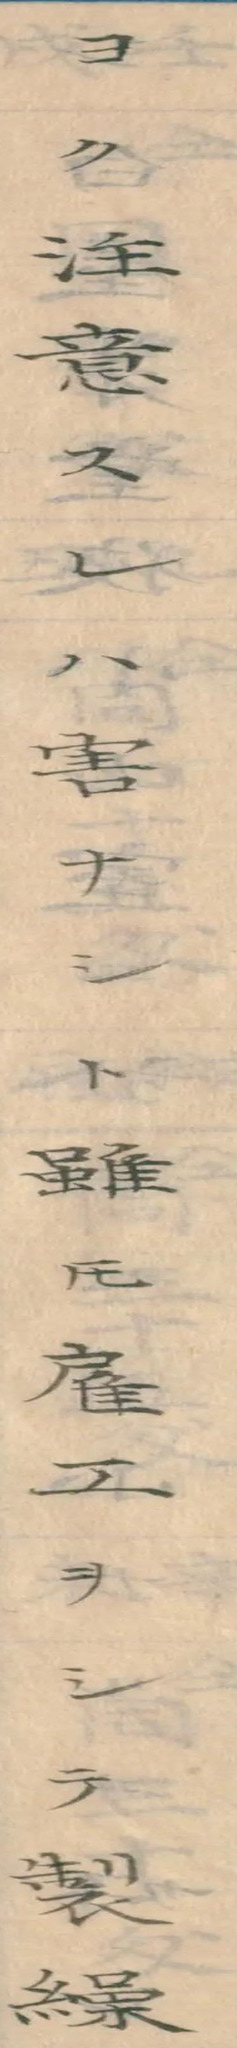ヨク注意スレハ害ナシト雖トモ雇工ヲシテ製繰
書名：蚕桑集成
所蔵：国立国会図書館 National Diet Library, JAPAN
